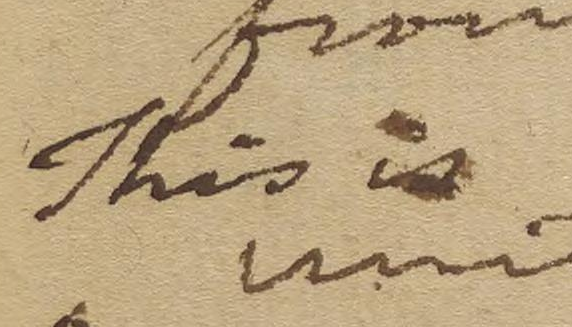This is
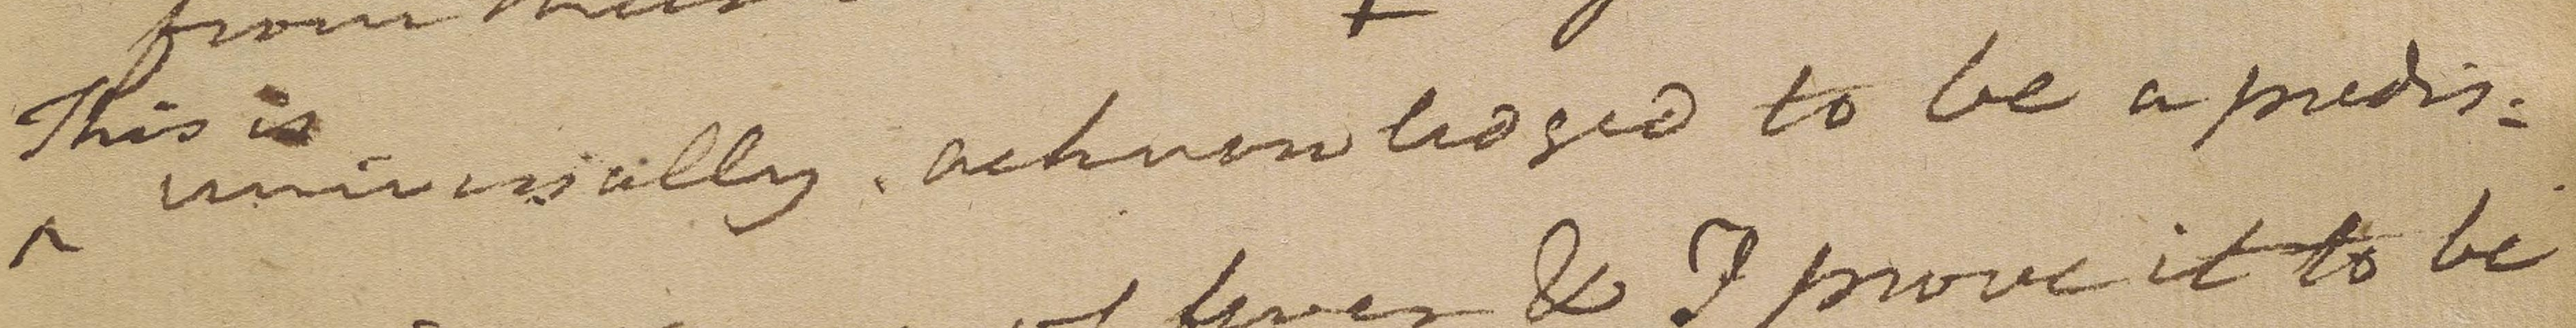^ universally acknowledged to be a predis-
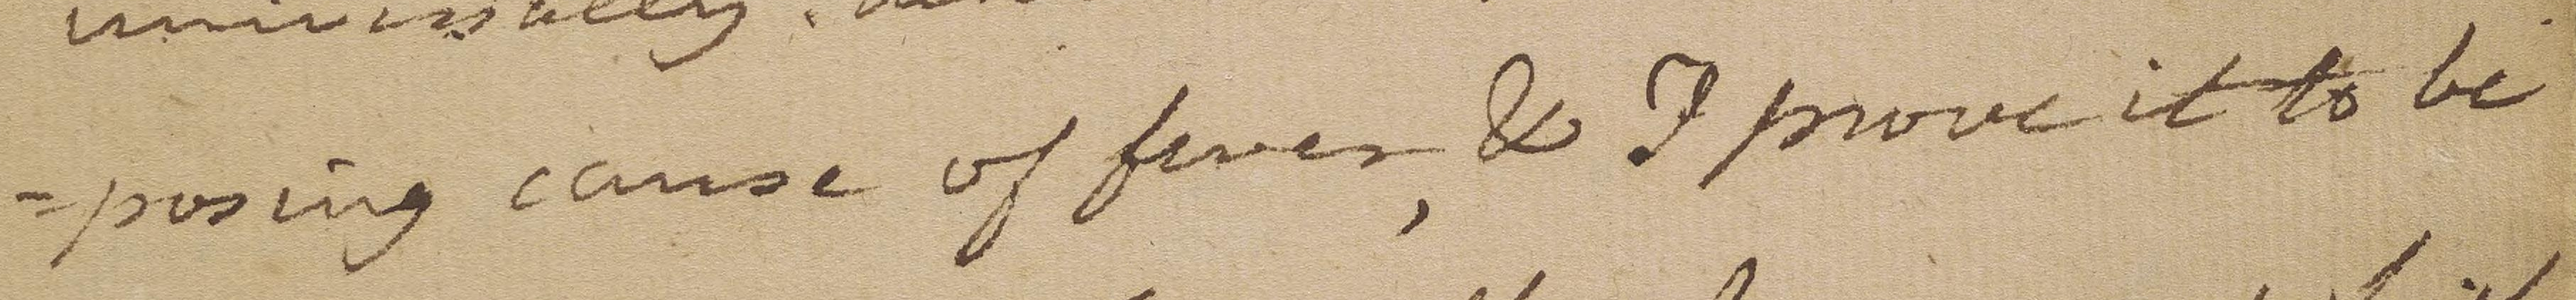-posing cause of fever, & I prove it to be
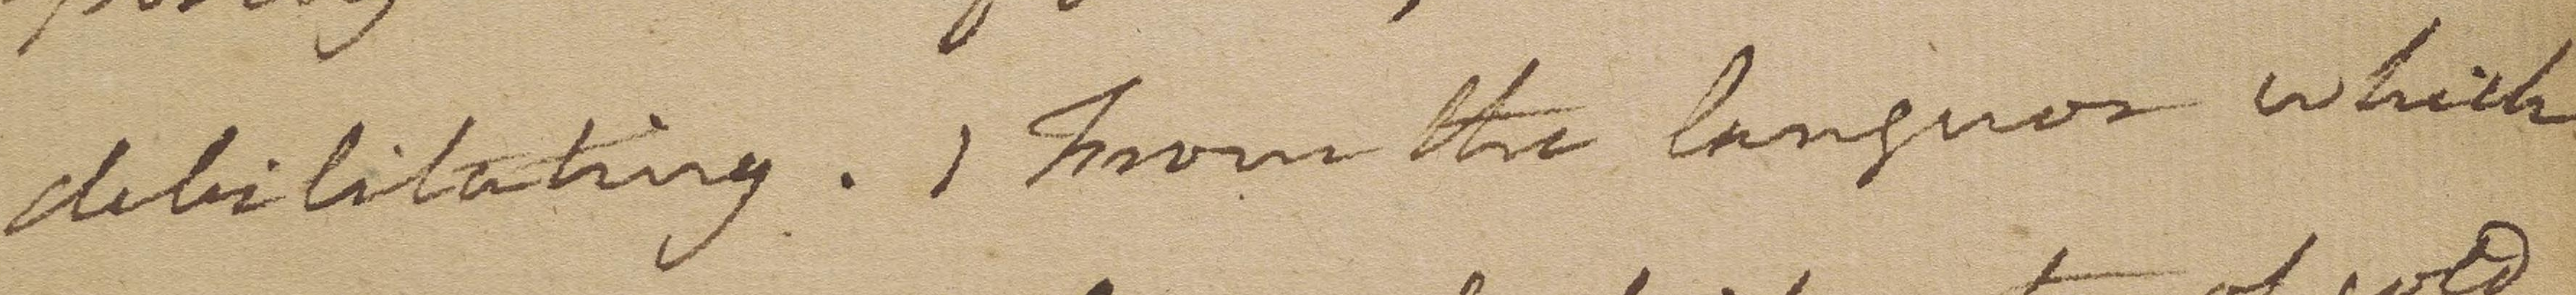debilitating. 1 From the langour which
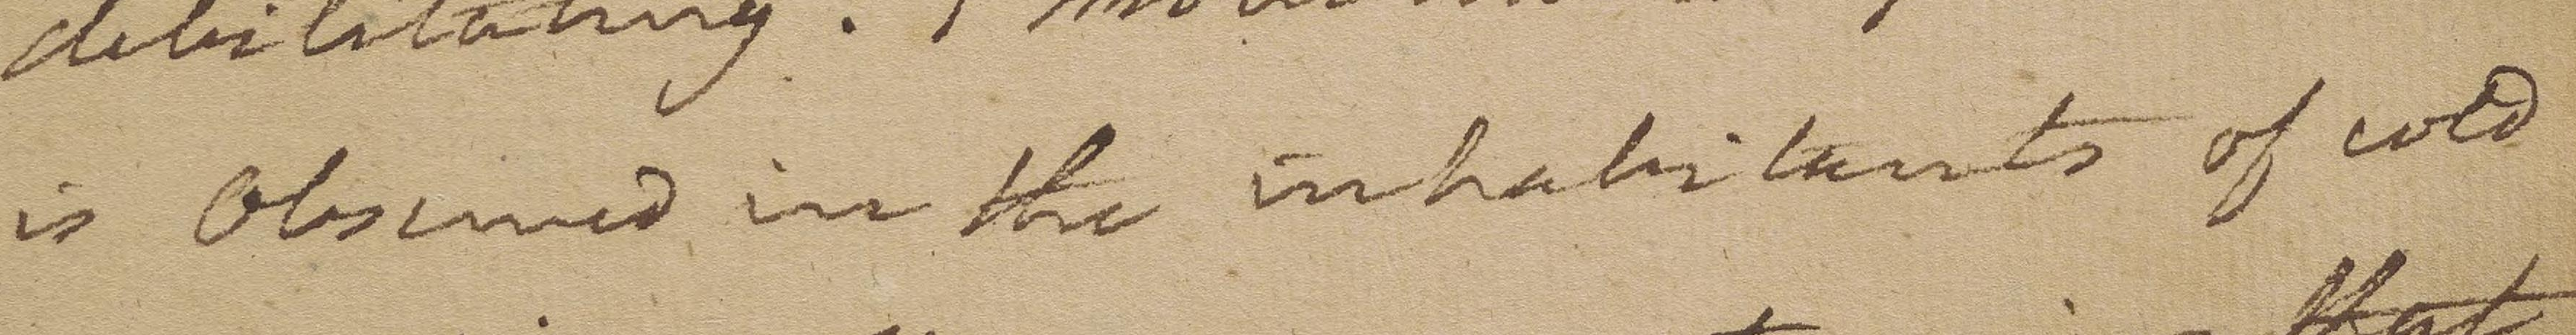is observed in the inhabitants of cold
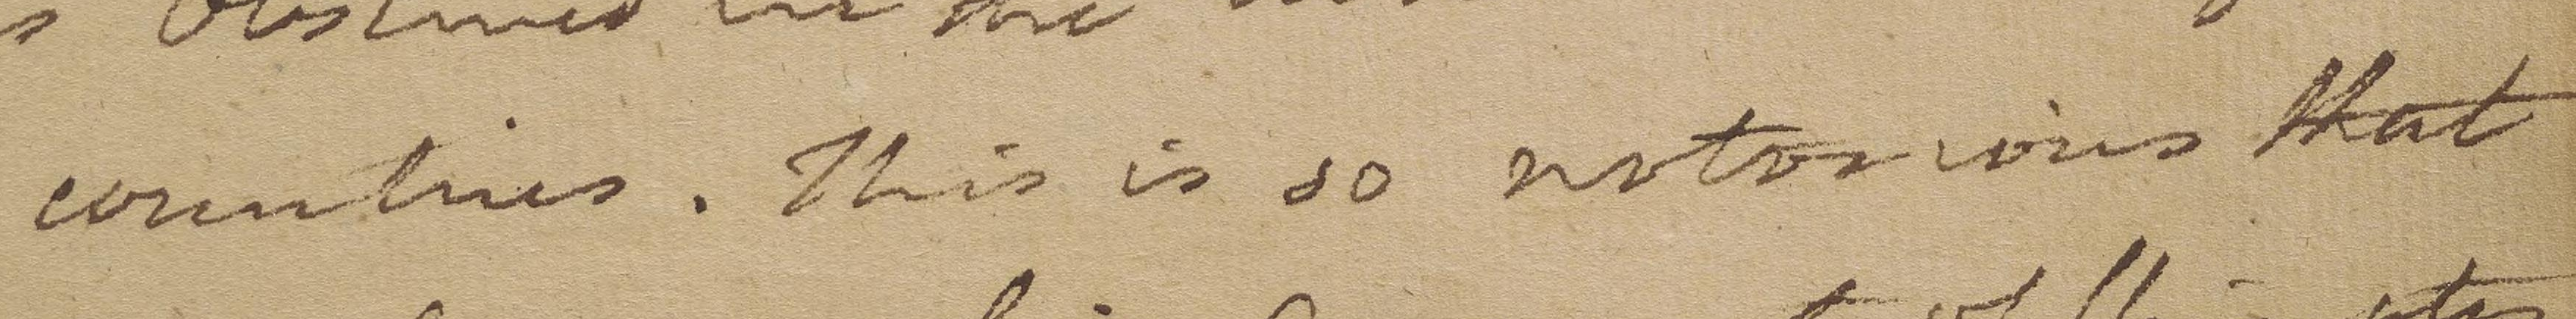countries. This is so notorious that
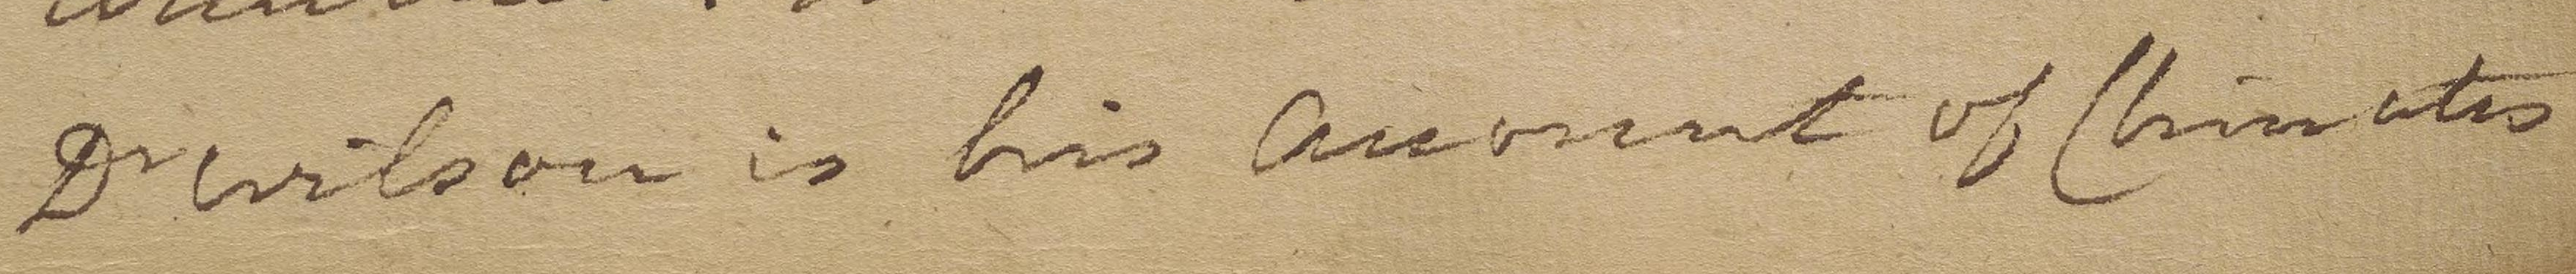D^r Wilson in his Account of Climates
